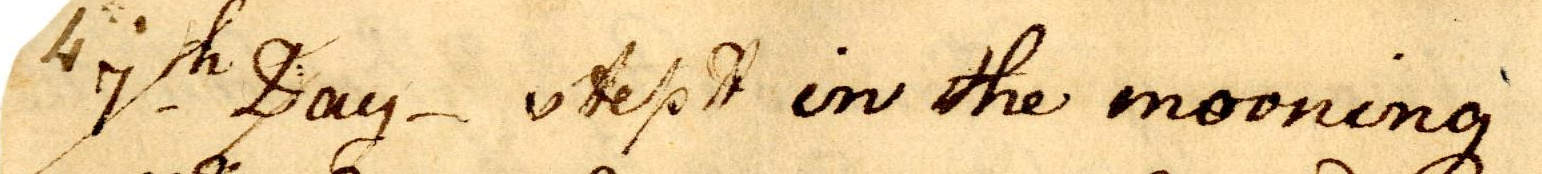^4 7^th Day - stept in the morning
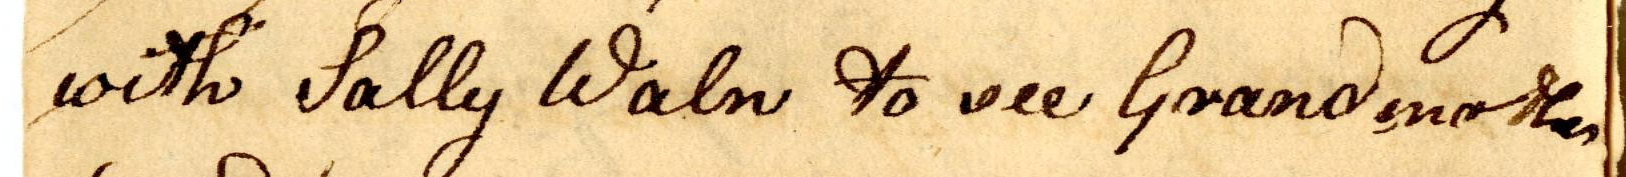with Sally Waln to see Grandmother
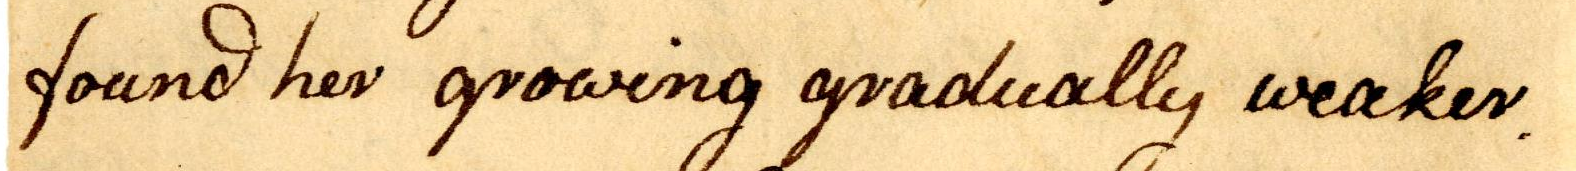found her growing gradually weaker
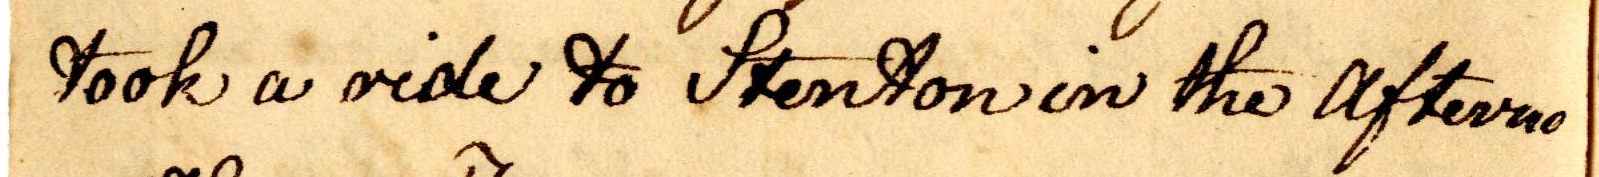took a ride to Stenton in the Afterno
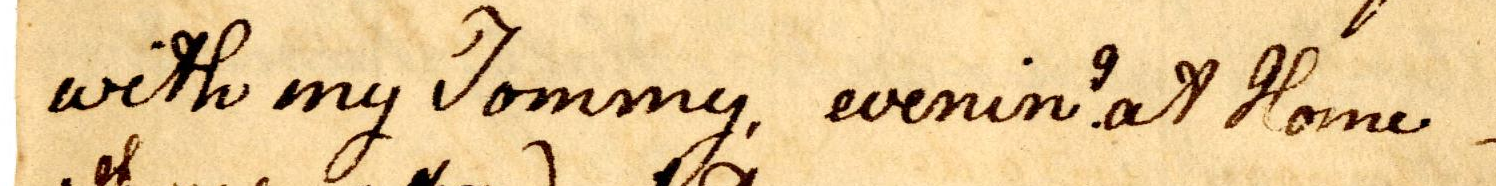with my Tommy, evenin^g. at Home -
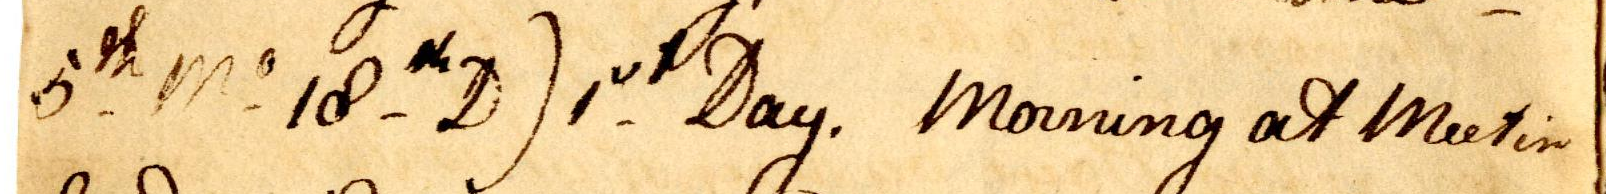5^th M^o 18^th D ) 1^st. Day. Morning at Meetin
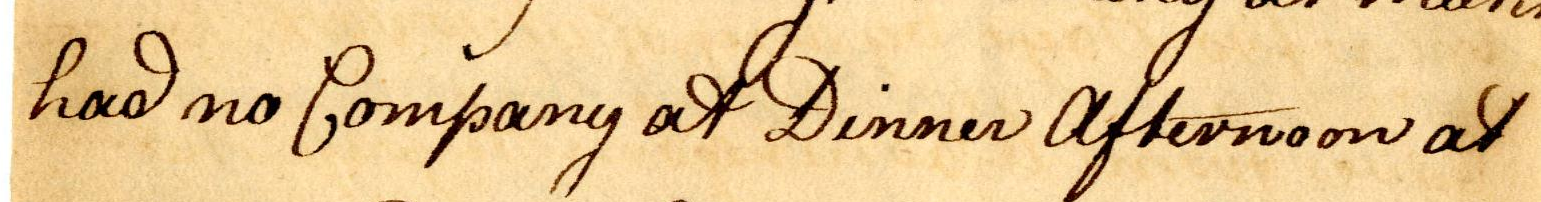had no Company at Dinner Afternoon at
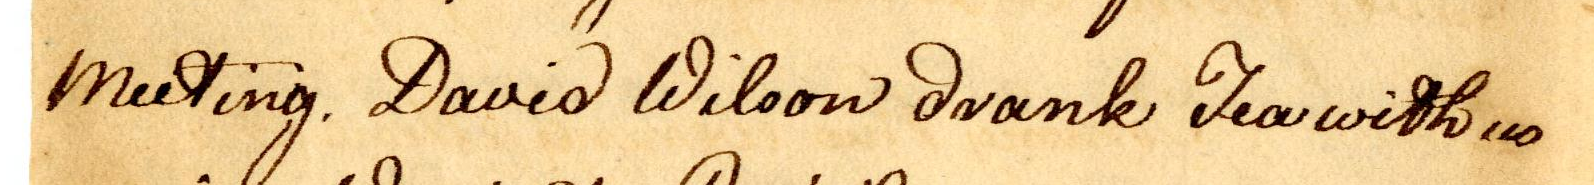Meeting. David Wilson drank Tea with us
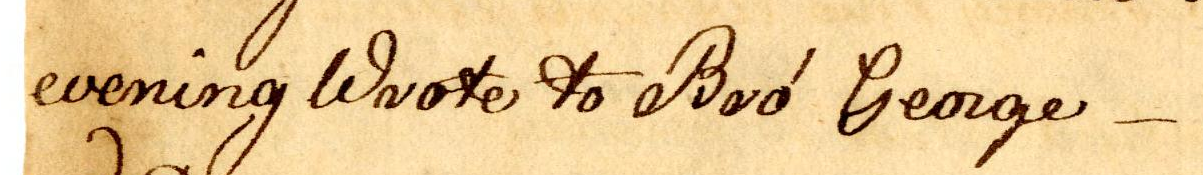evening Wrote to Bro' George-
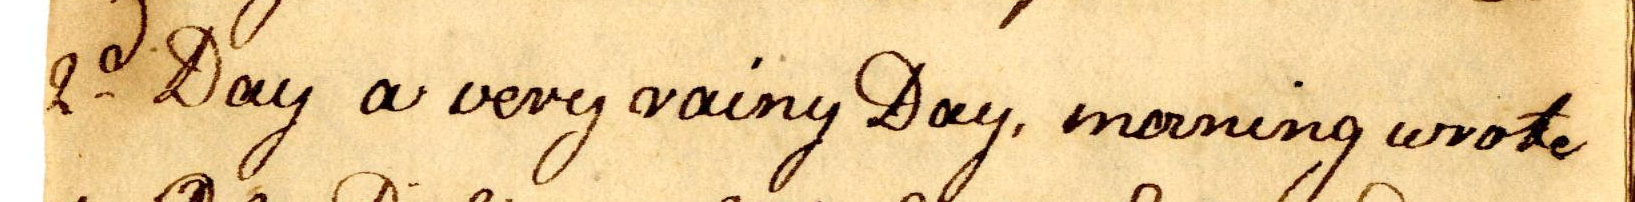2^d Day a very rainy Day. morning wrote
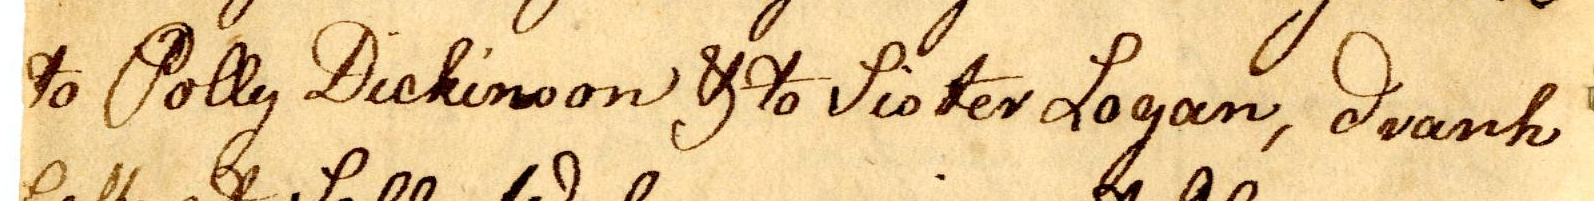to Polly Dickinson & to Sister Logan, drank
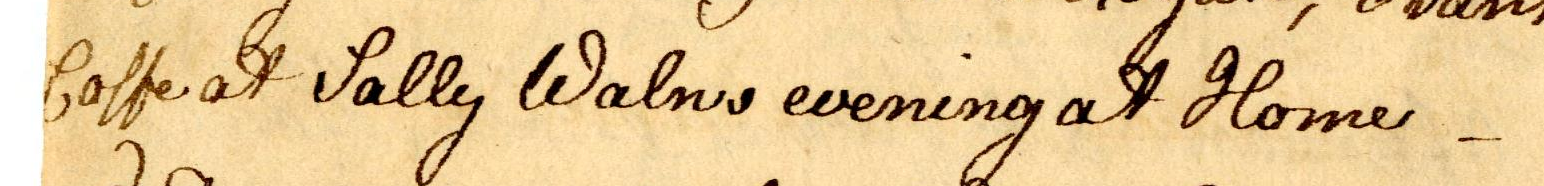Coffe at Sally Walns evening at Home-
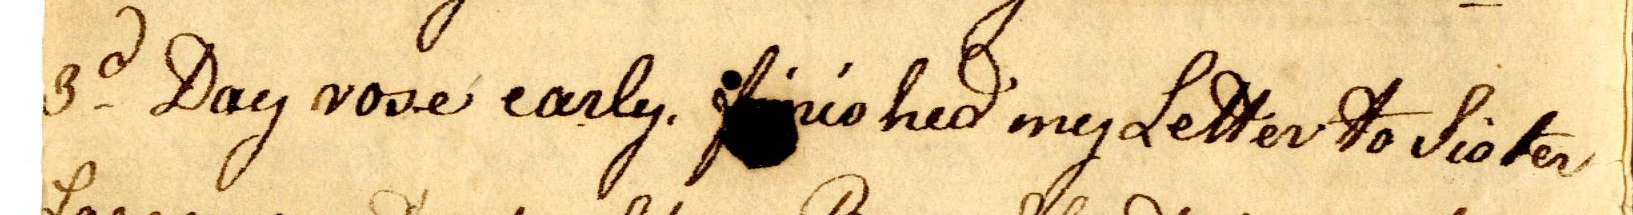3^d Day rose early. finished my Letter to Sister
